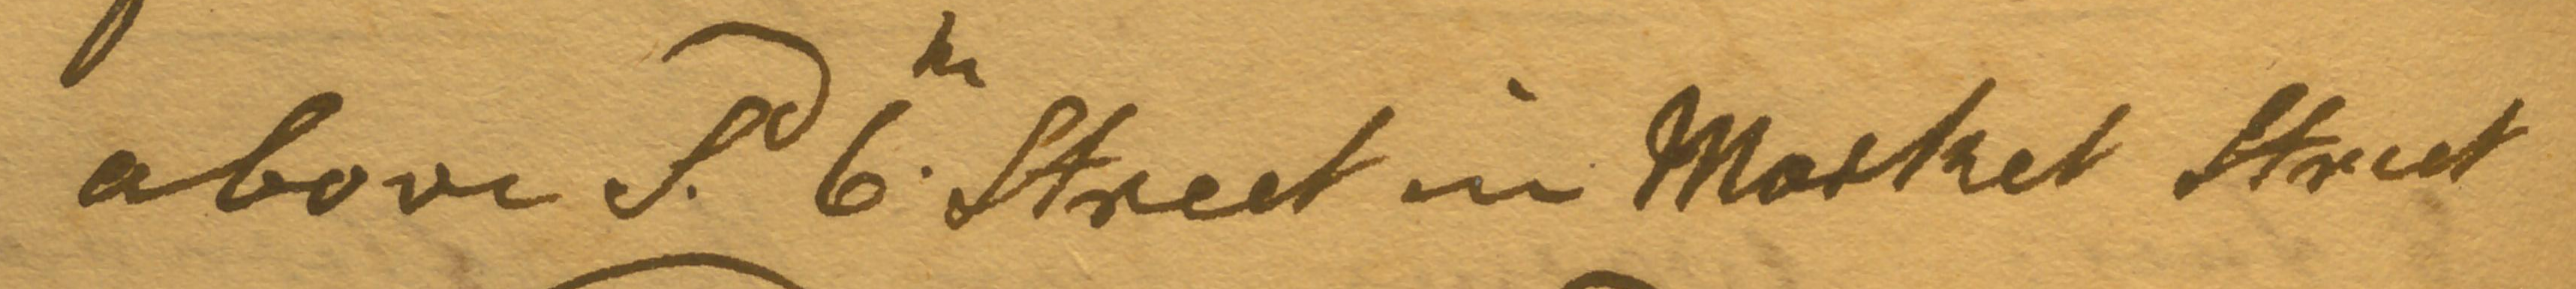above s^d. 6^th. Street in Market Street
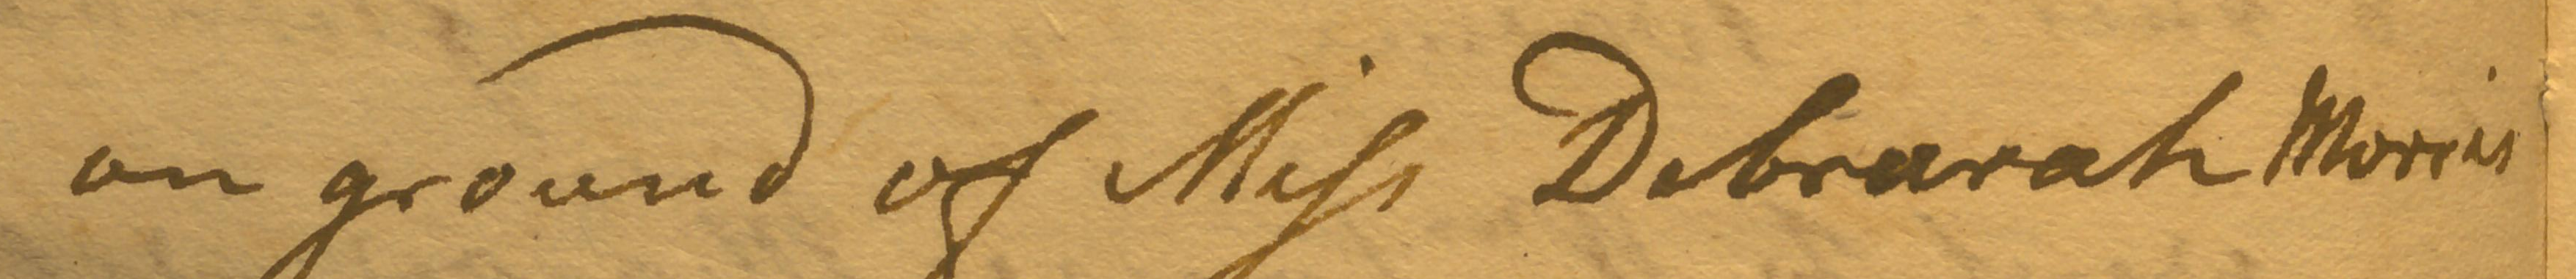on ground of Mess Debrarah Morris
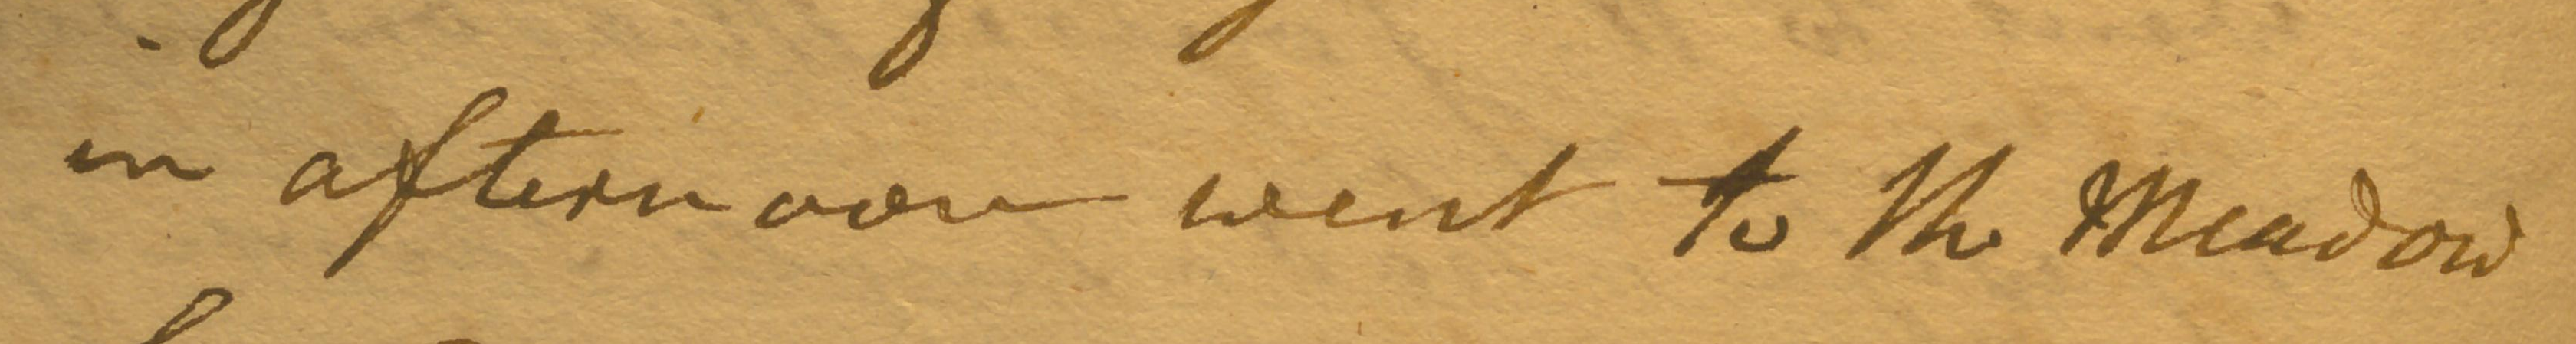in afternoon went to the Meadow
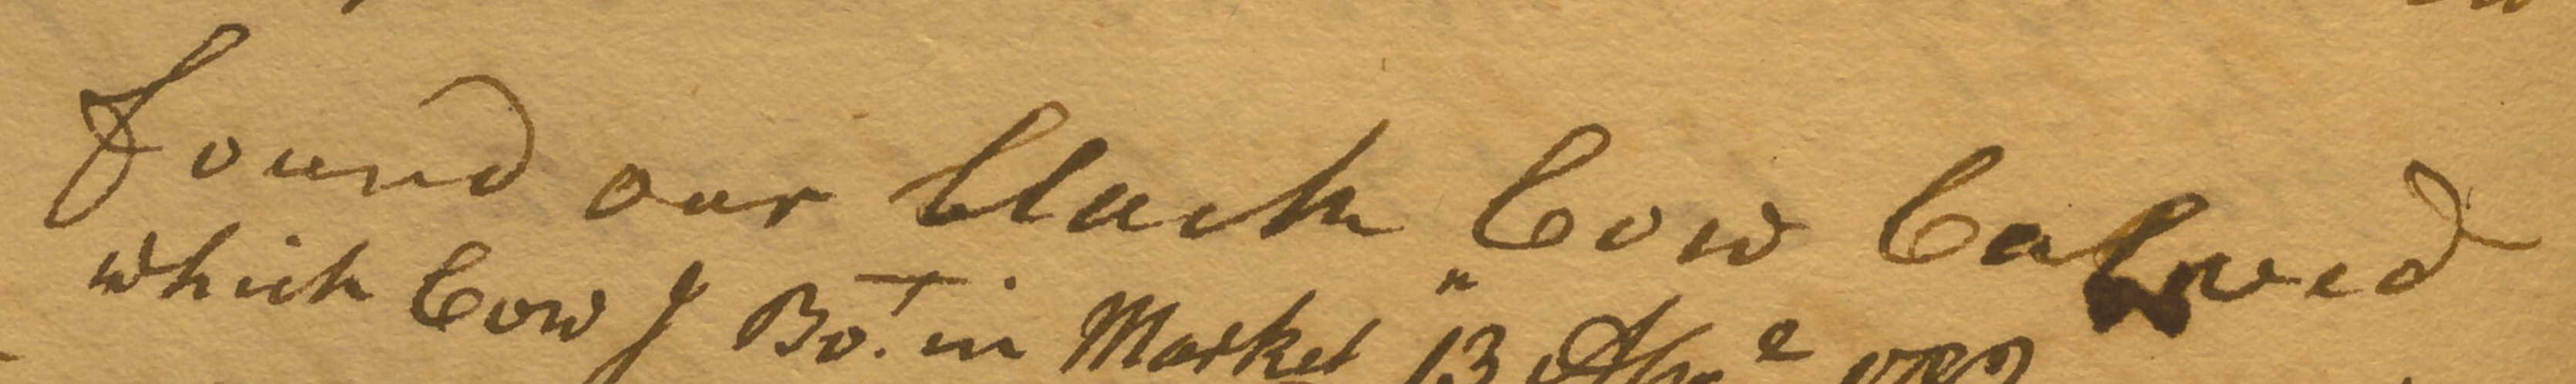found our black Cow Calved
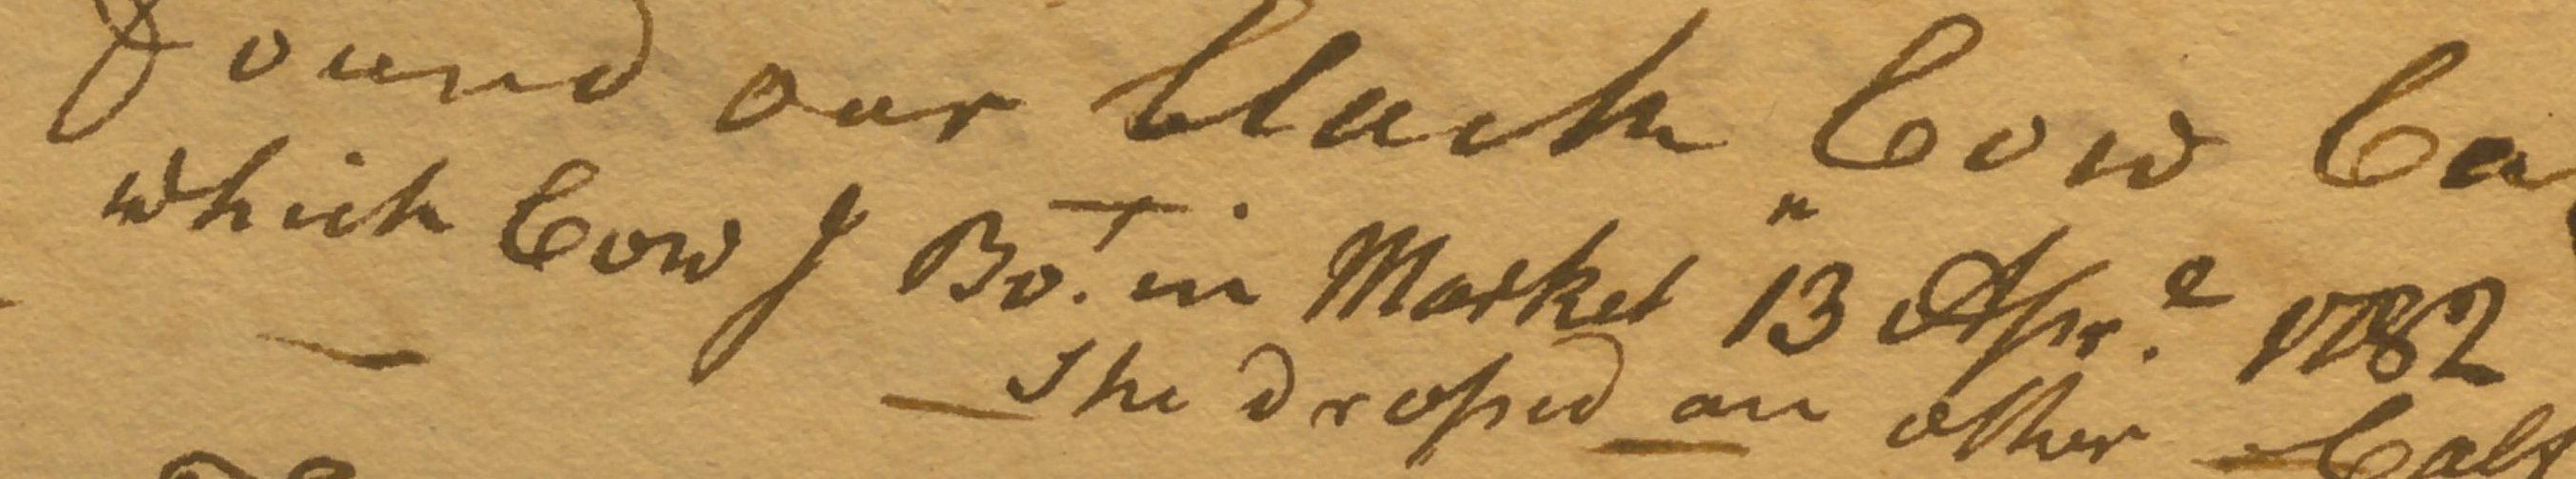which Cow I Bo^t. in Market 13^th Apr^l. 1782
